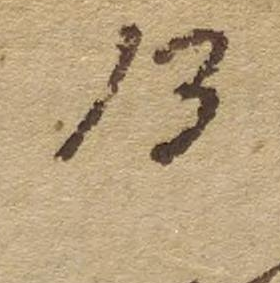13
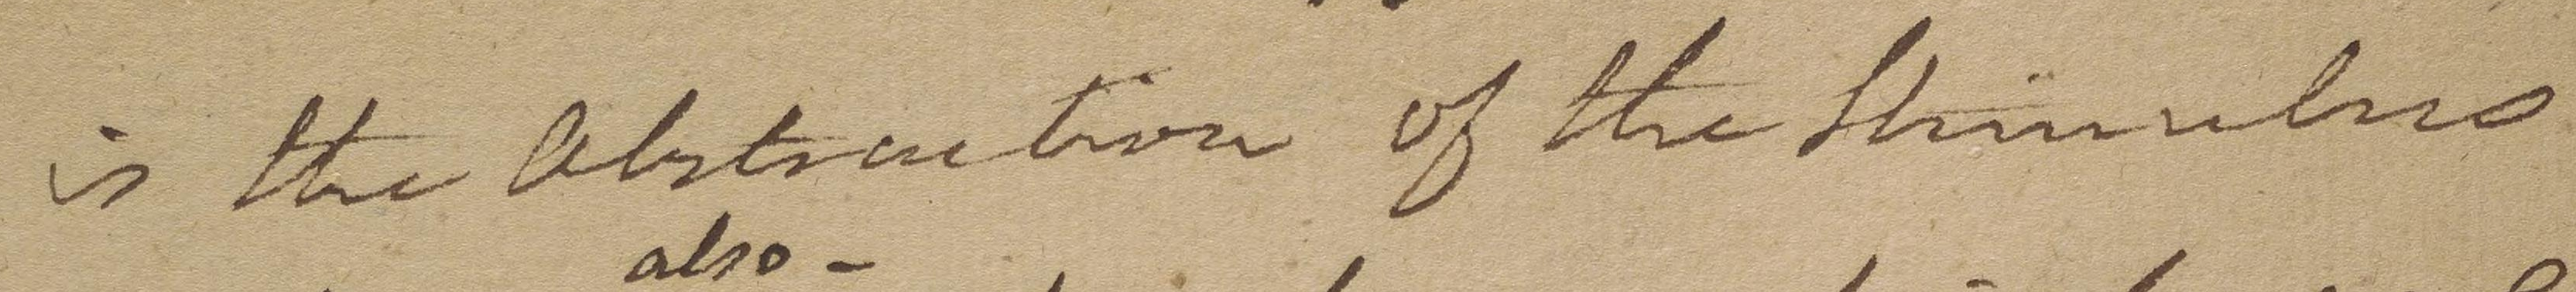is the abstraction of the stimulus
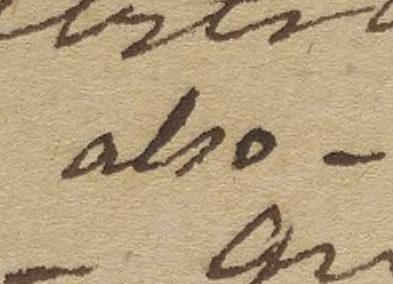also
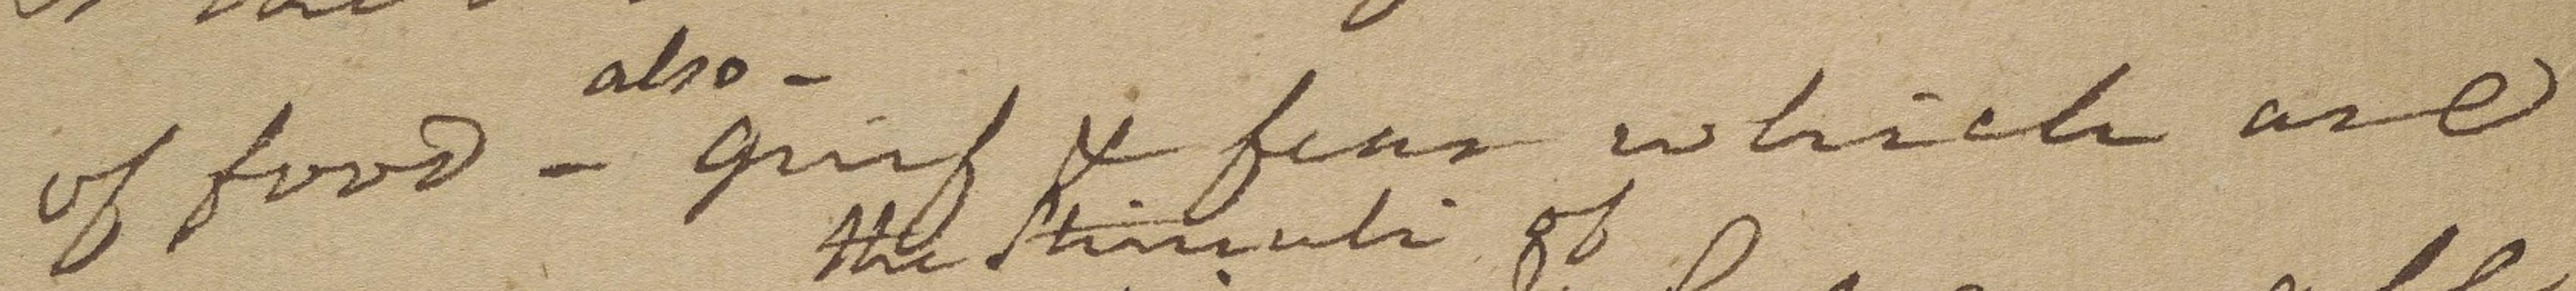of food. grief & fear which are
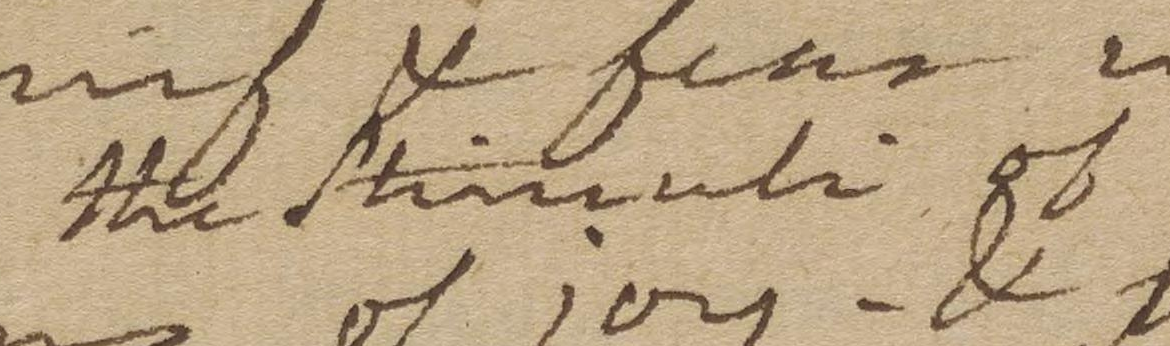the stimuli of
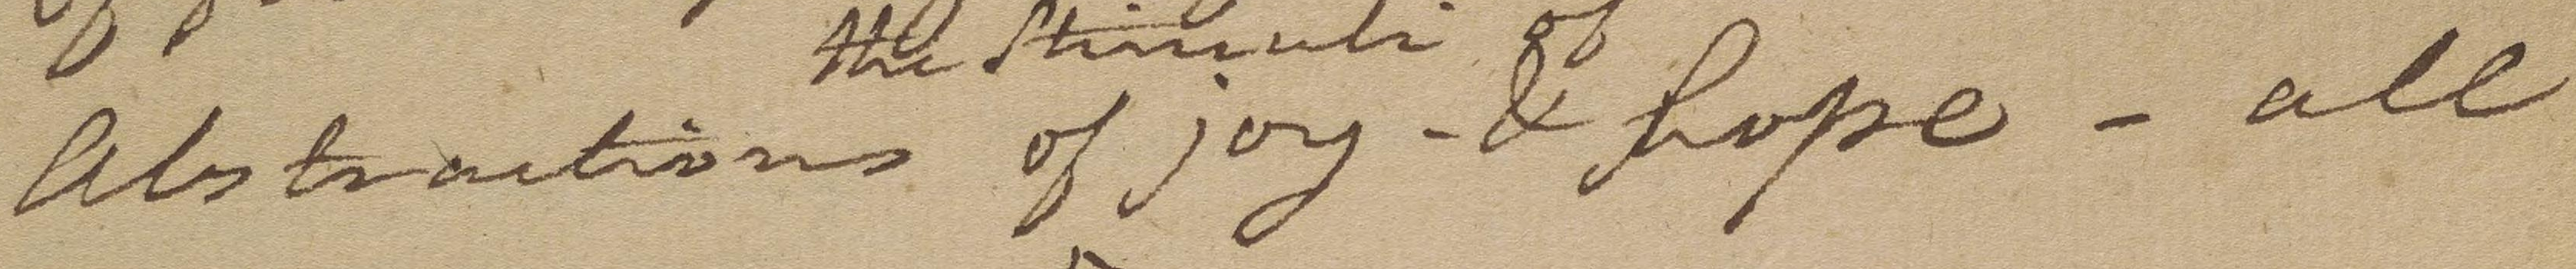abstractions of joy - & hope- all
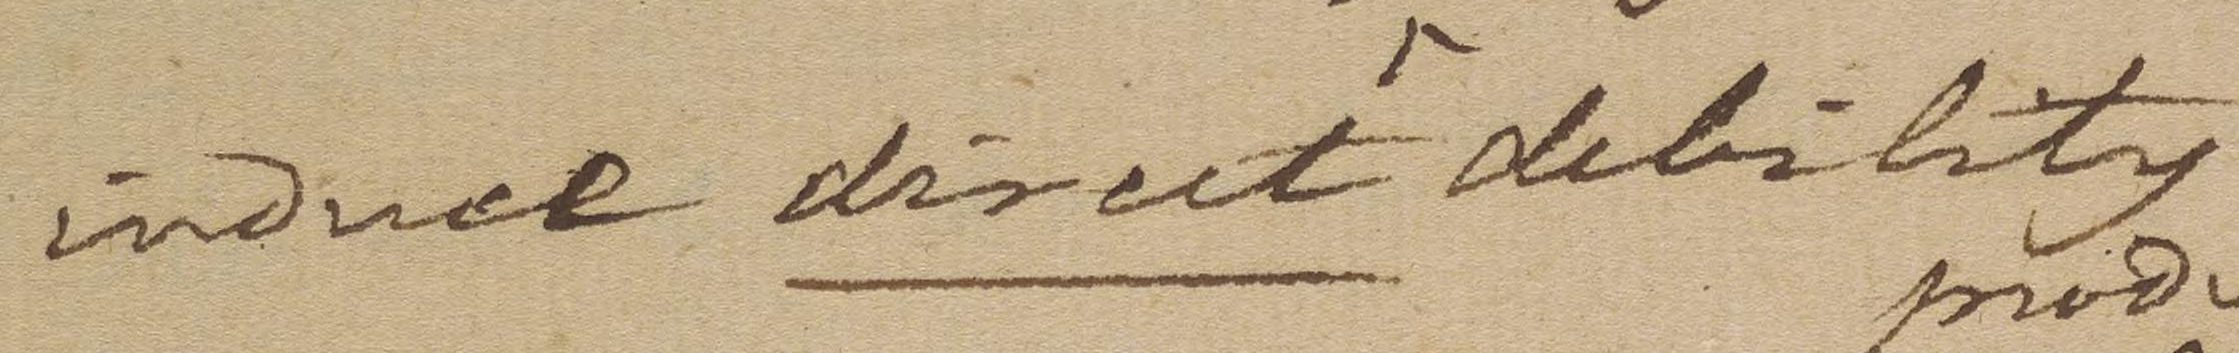induce direct debility.
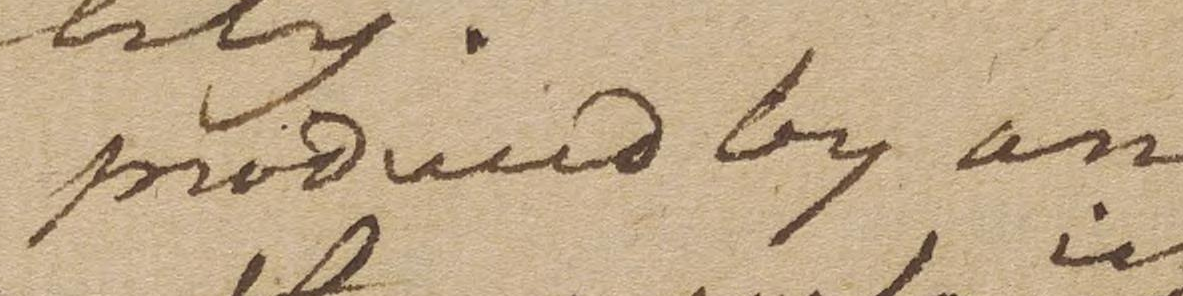produced by an
